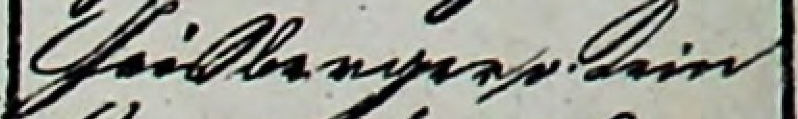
Geisberger v. Kein
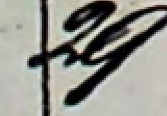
29
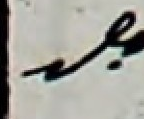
do
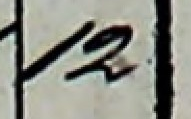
12
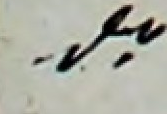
do
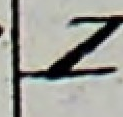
I
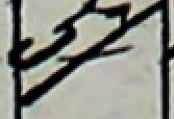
57
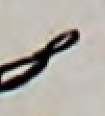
8
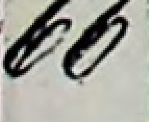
66
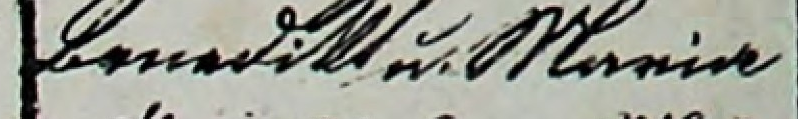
Benedikt u. Maria
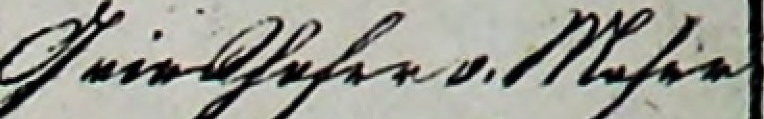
Grieshofer v. Moser
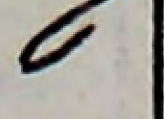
6
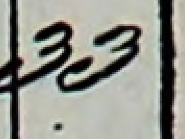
33
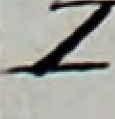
I
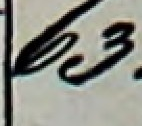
63
